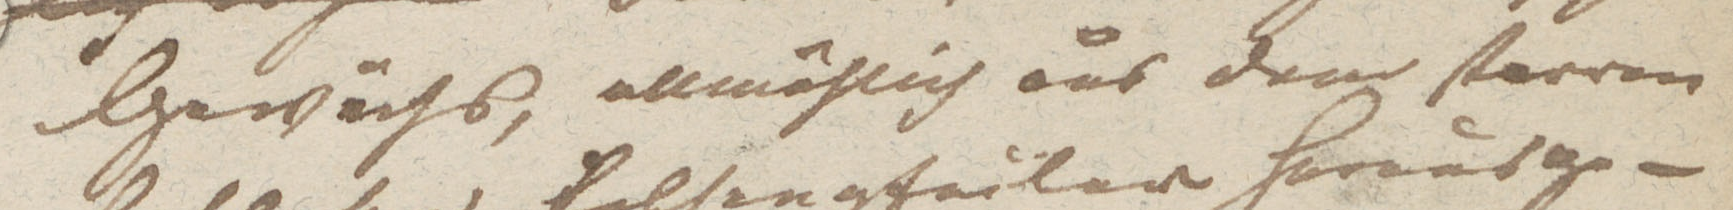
Gewächs, allmählich aus dem starren
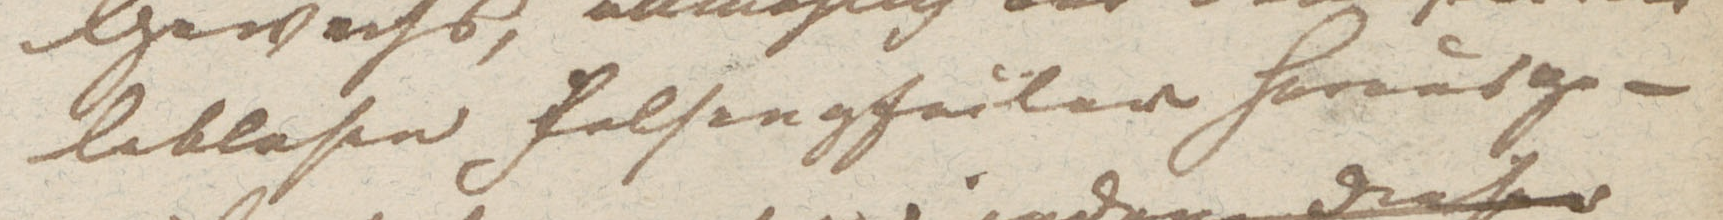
leblosen Felsenpfeiler Herausge-
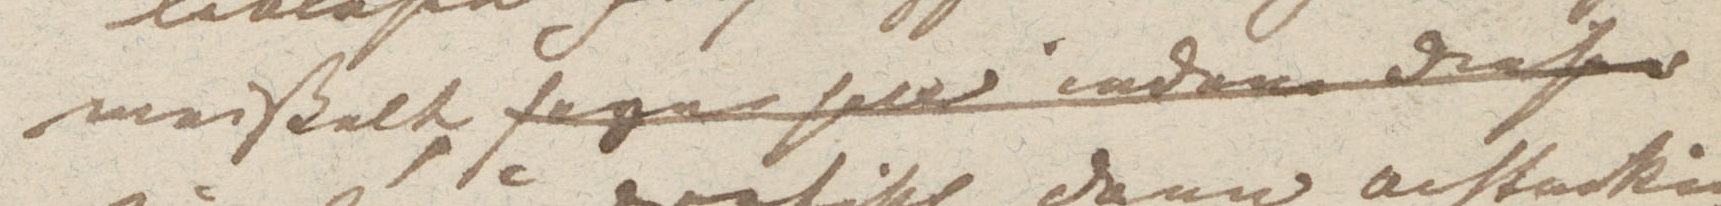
meisselt, seyn soll indem dieser
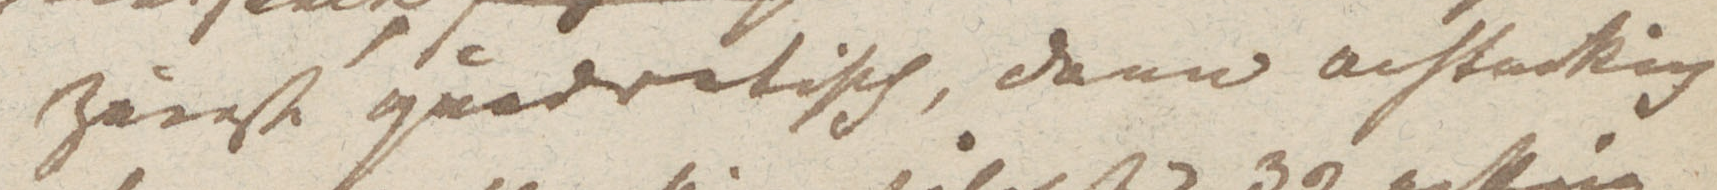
zuerst quadratisch, dann achteckig
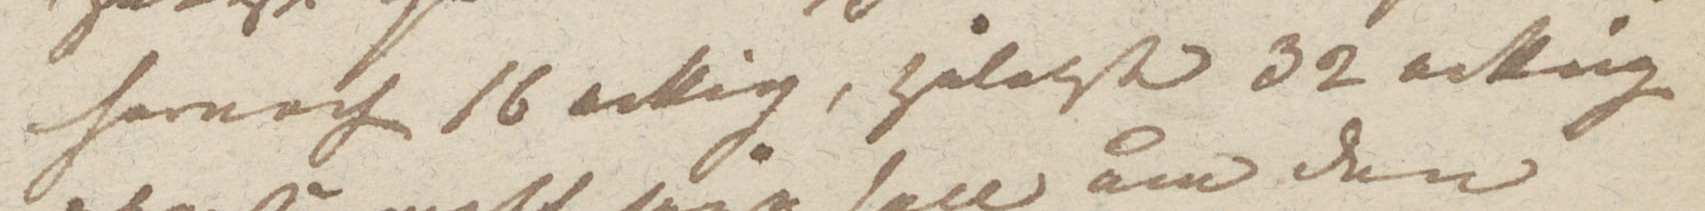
hernach 16 eckig, zuletzt 32 eckig
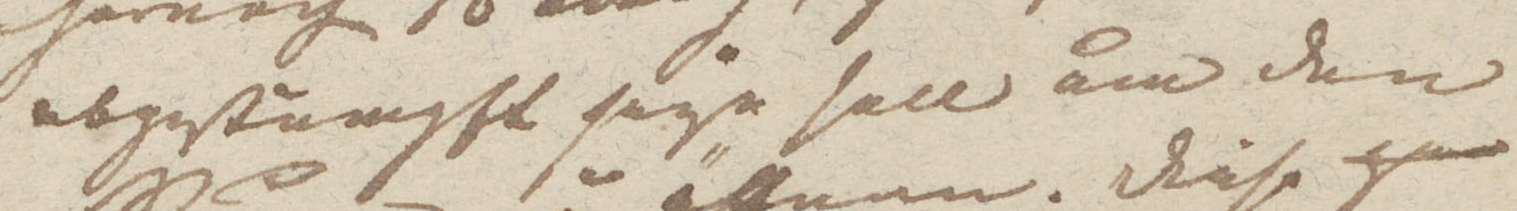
abgestumpft seyn soll um den
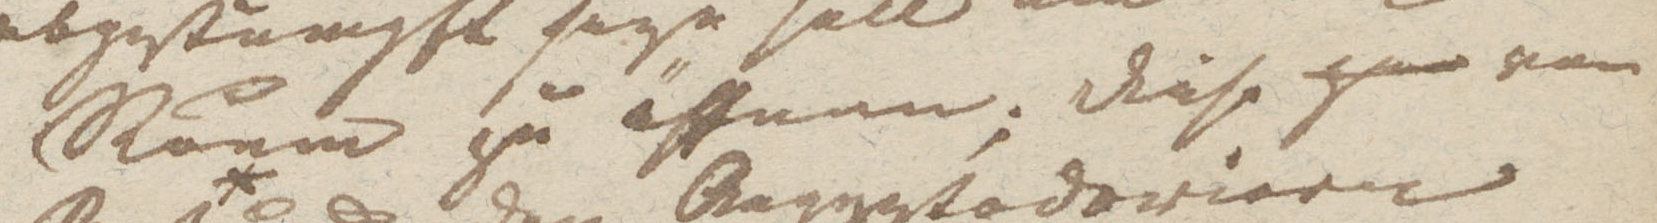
Raum zu öffnen; Diese zum von
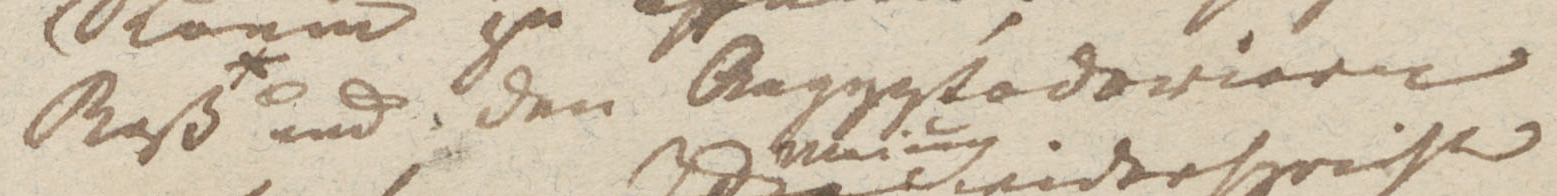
Ross % und den Aegyptodoriern
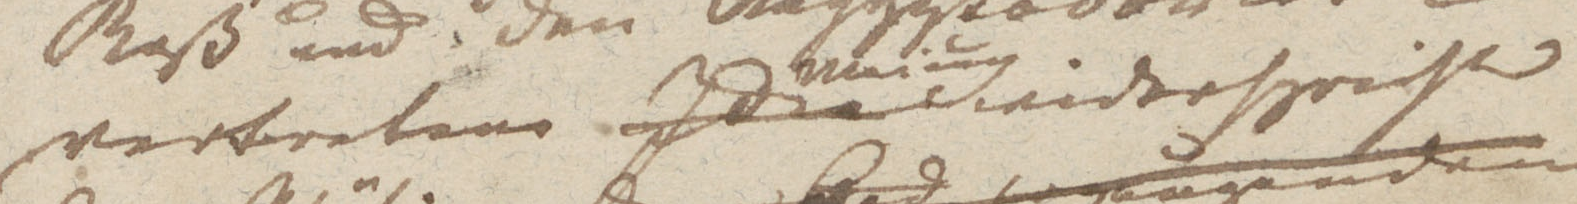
vertretene Idee Meinung widerspricht
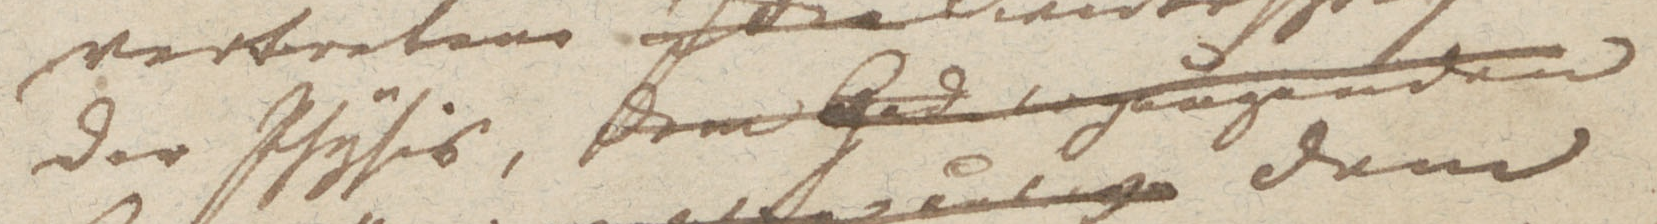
der Physis, dem Ged erzeugenden
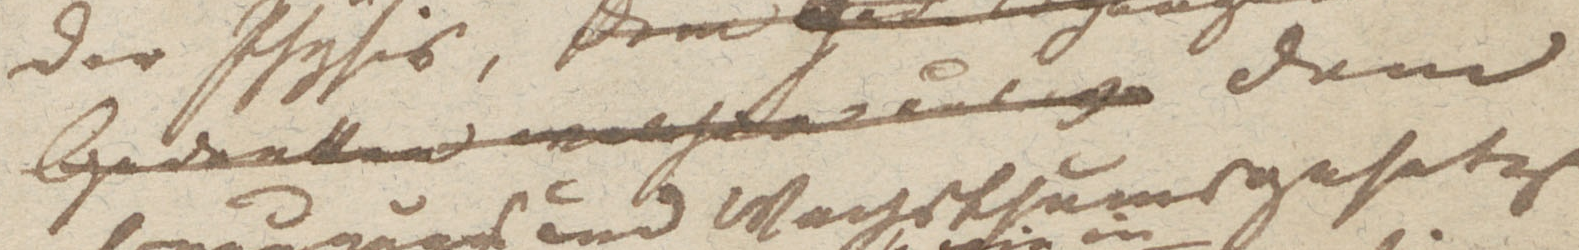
Gedanken welchen uw dem
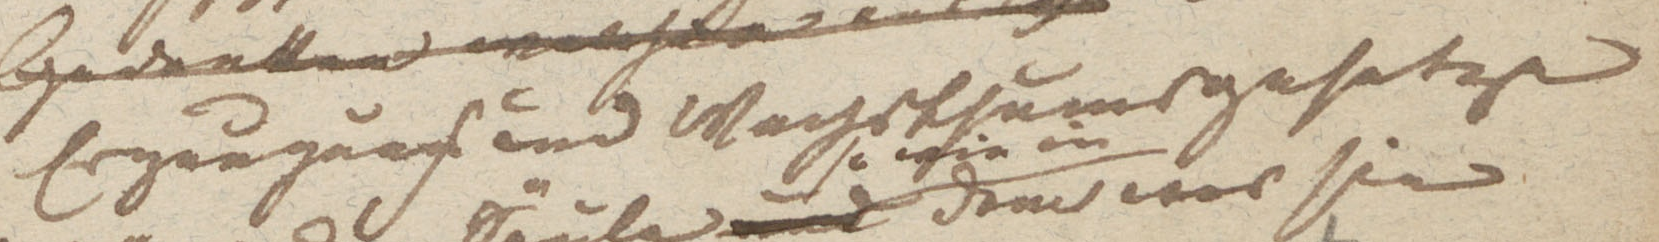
Erzeugungs und Wachsthumsgesetze
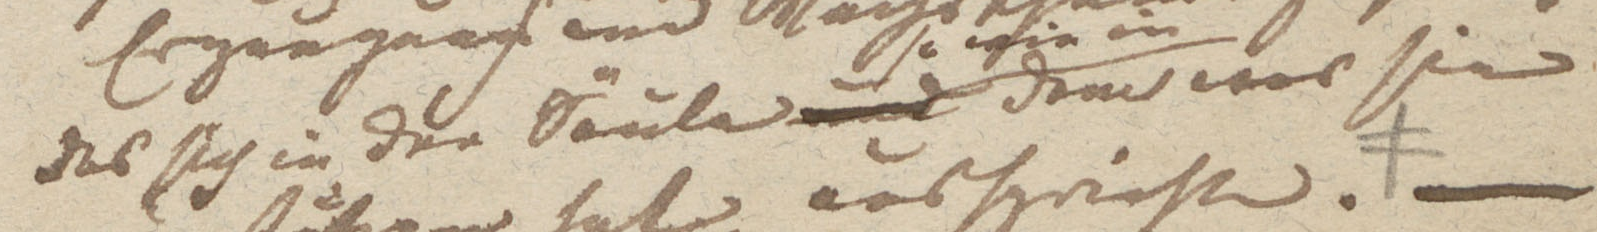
das sich in der Säule und so wie in dem was sie
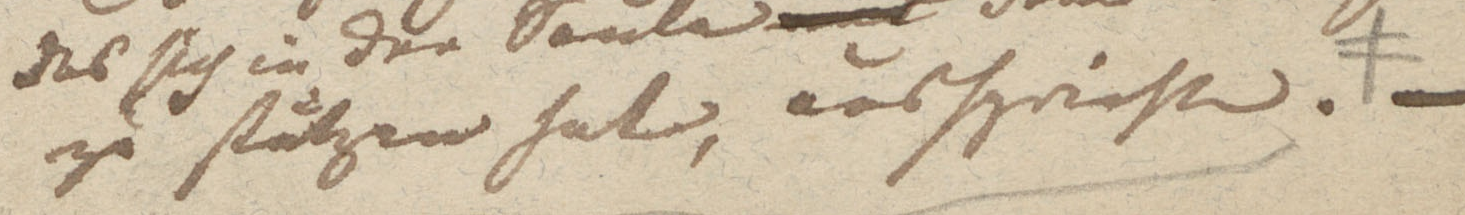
zu stützen hat, ausspricht % – .
